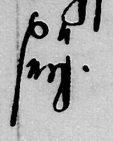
den,
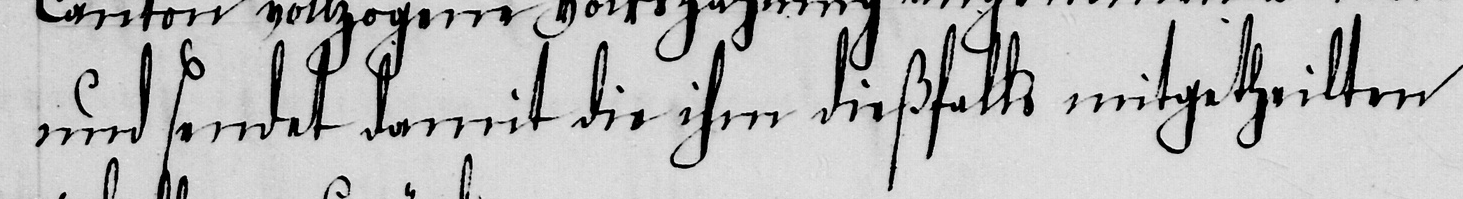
und sendet damit die ihm dießfalls mitgetheilten
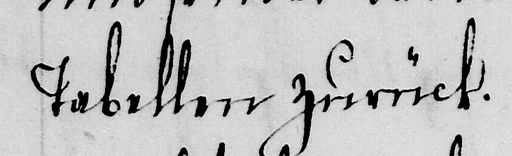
Tabellen zurück.
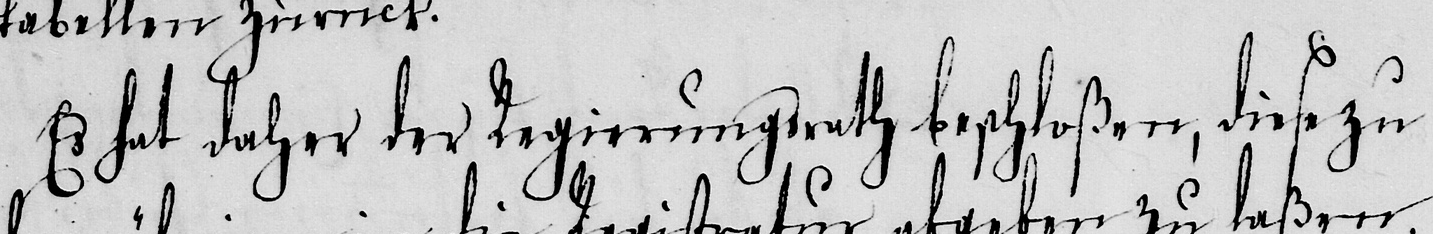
Es hat der Regierungsrath beschloßen, diese zu
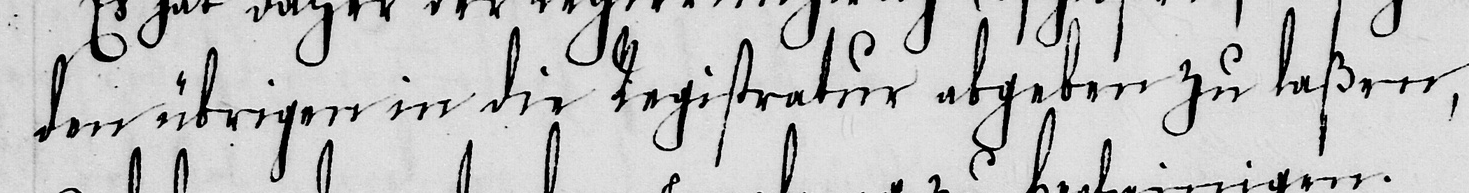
den übrigen in die Registratur abgeben zu laßen,
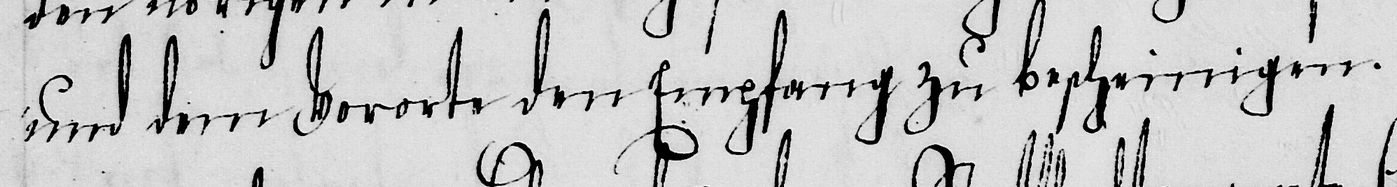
und dem Vororte den Empfang zu bescheinigen.
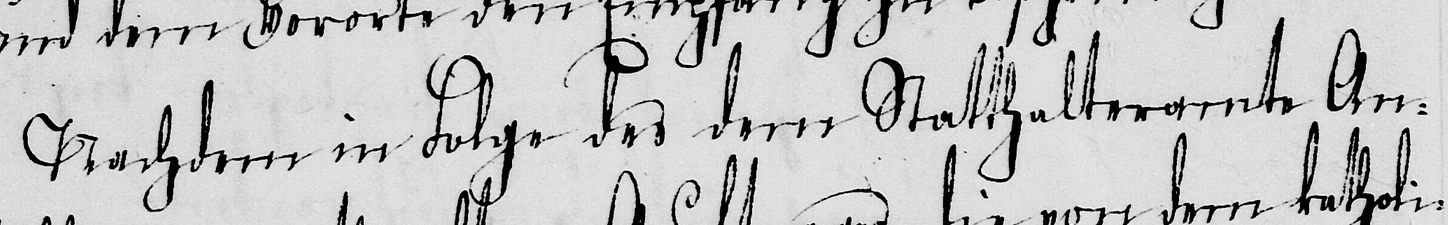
Nachdem in Folge des dem Statthalteramte An¬
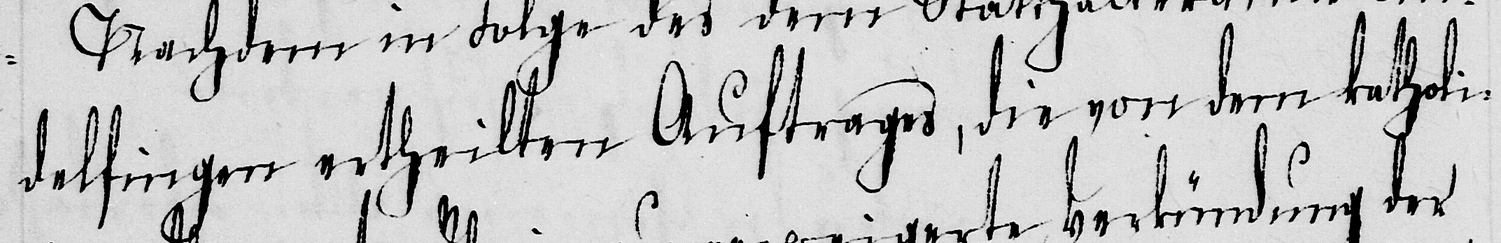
delfingen ertheilten Auftrages, die von dem katholi¬
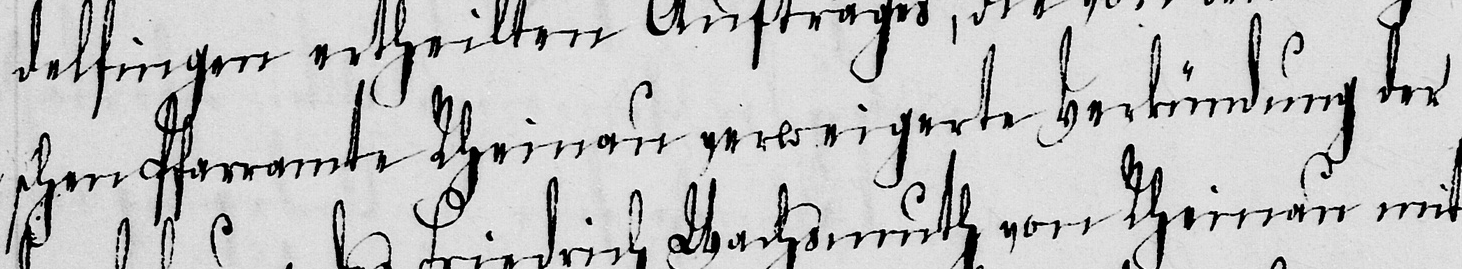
schen Pfarramte Rheinau verweigerte Verkündung der
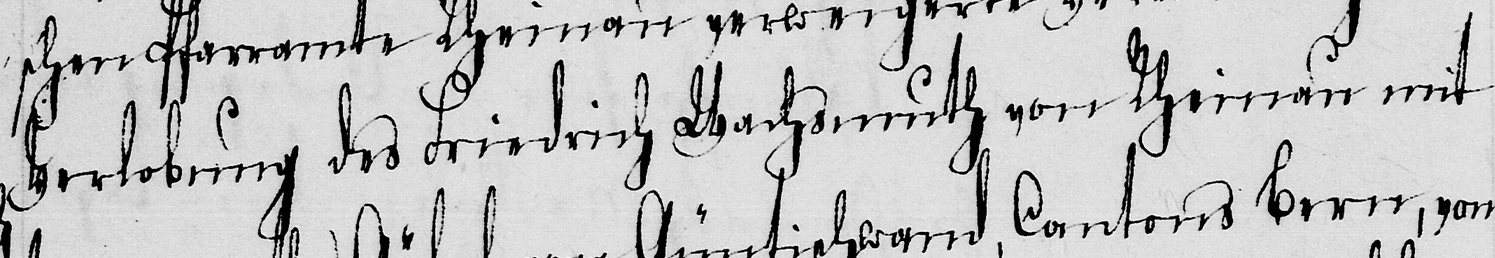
Verlobung des Friedrich Wachsmuth von Rheinau mit
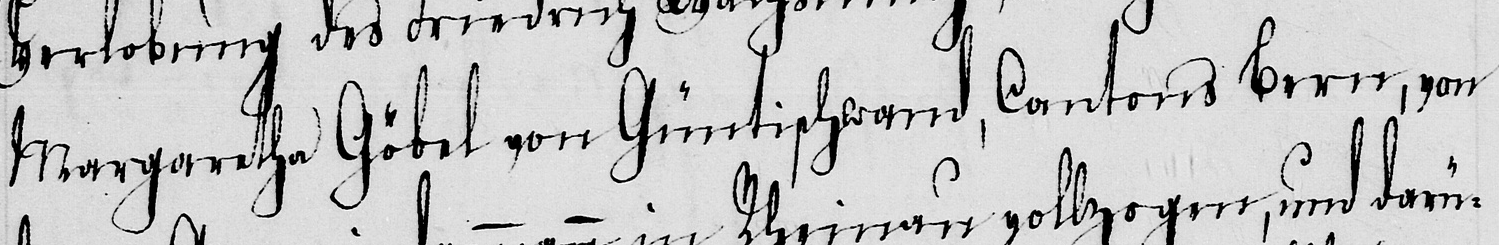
Margaretha Göbel von Güntischwand Cantons Bern, von
